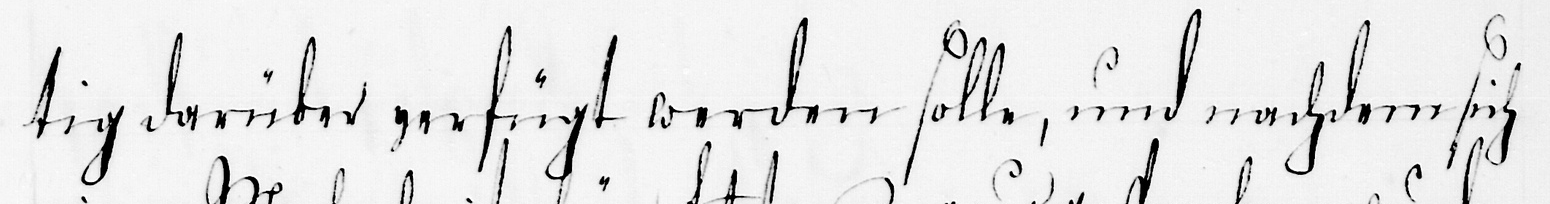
tig darüber verfügt werden solle, und nachdem sich
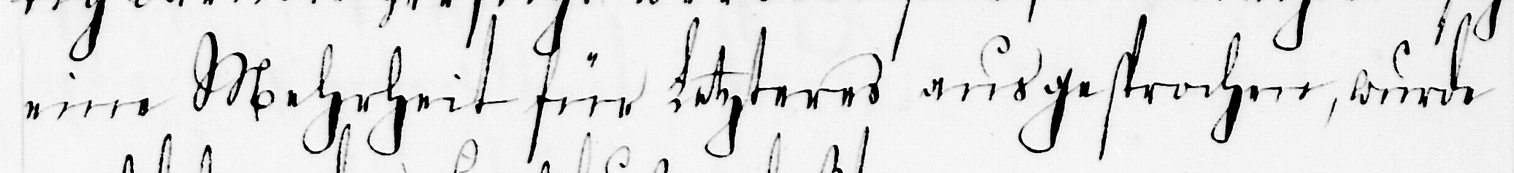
eine Mehrheit für Letzeres ausgesprochen, wurde
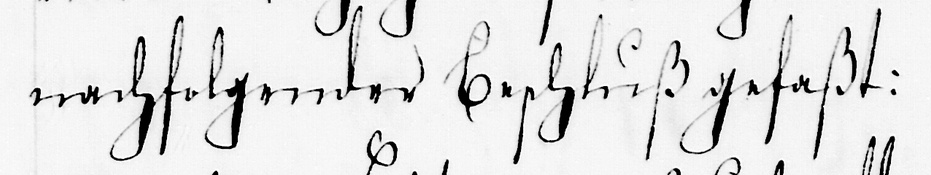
nachfolgender Beschluß gefaßt:
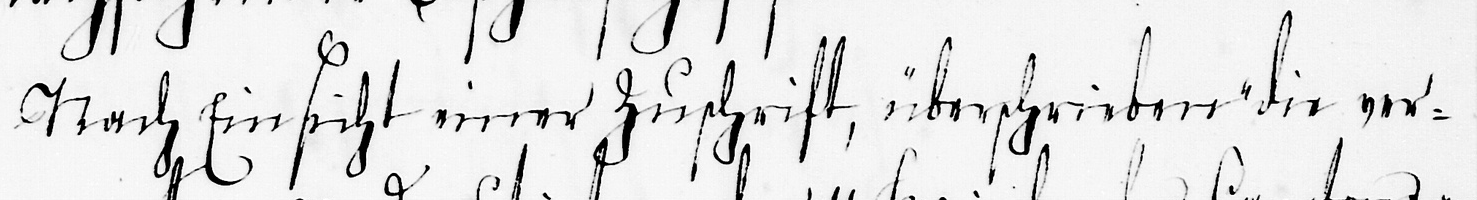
Nach Einsicht einer Zuschrift, überschrieben „die ver¬
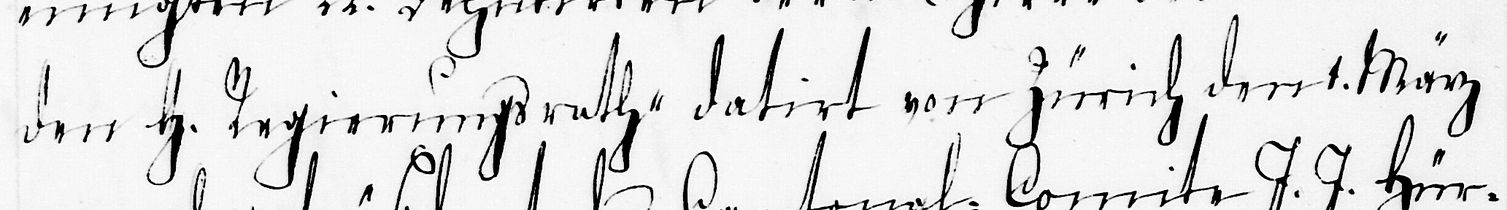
den H. Regierungsrath“ datirt von Zürich den 1. März
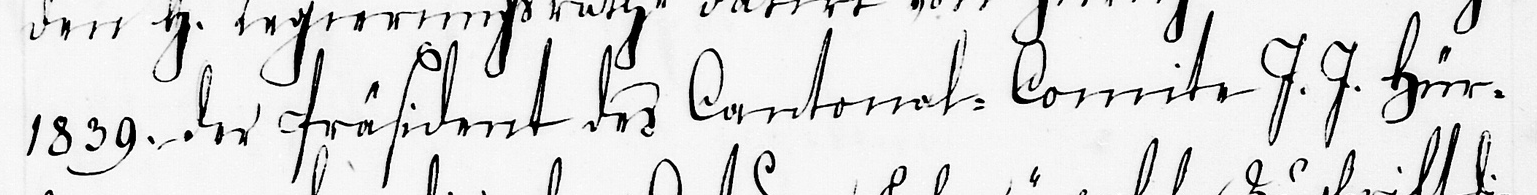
1839. – der Präsident des Cantonal-Comite J. J. Hür¬
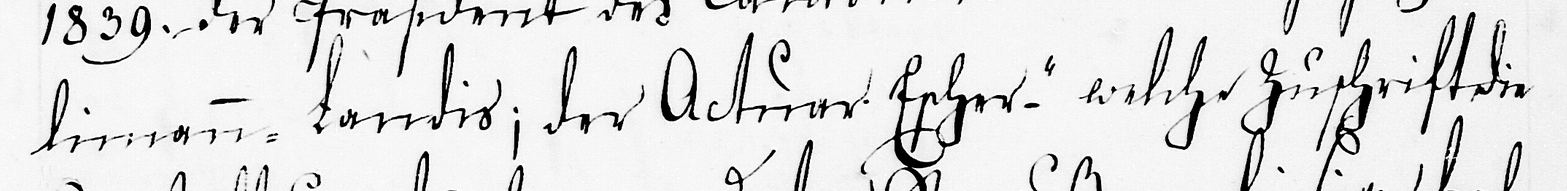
limann-Landis; der Actuar Escher – welche Zuschrift die
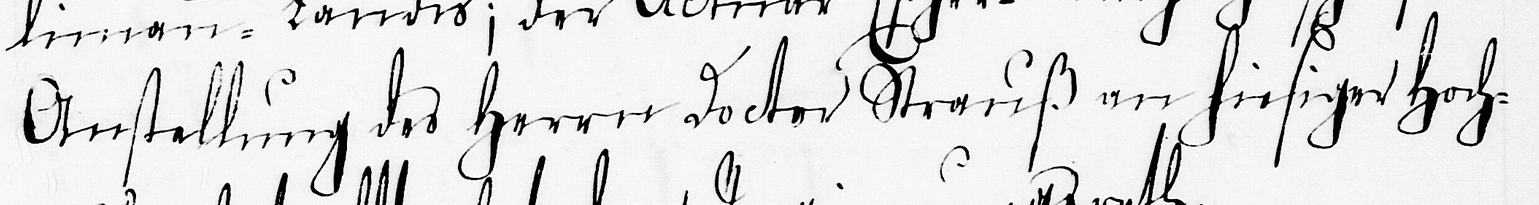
Anstellung des Herrn Doctor Strauß an hiesiger Hochs¬
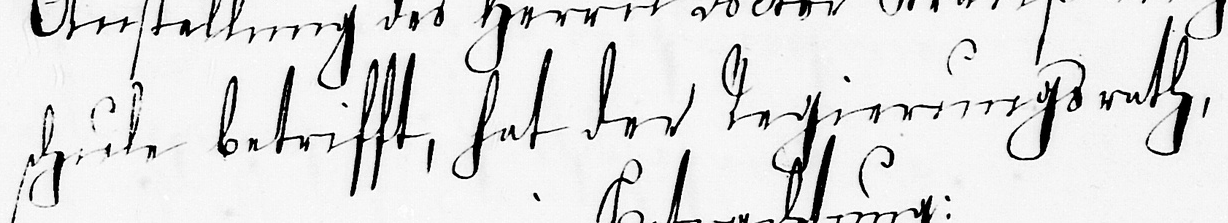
chule betrifft, hat der Regierungsrath,
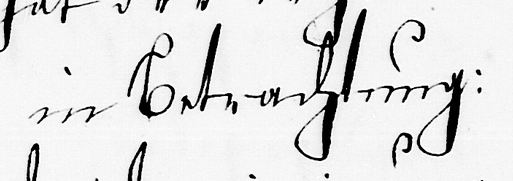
in Betrachtung:
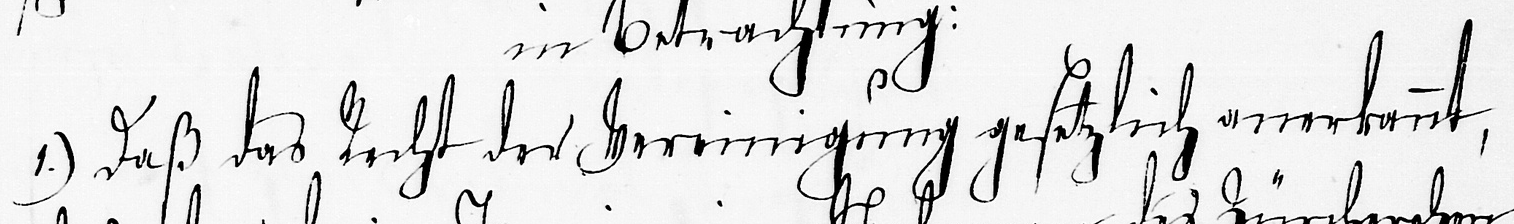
1.) Daß das Recht der Vereinigung gesetzlich anerkannt,
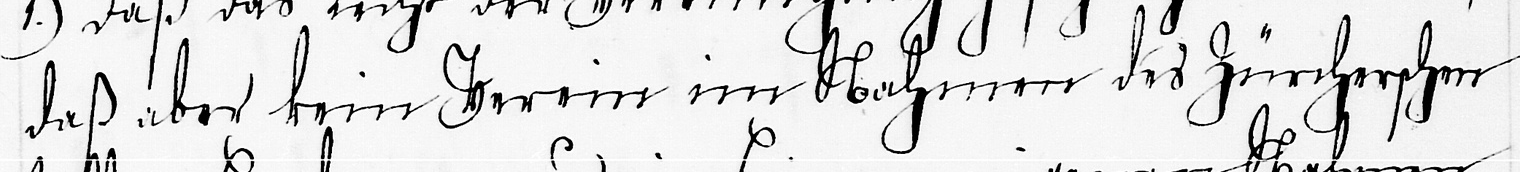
daß aber kein Verein im Nahmen des Zürcherschen
